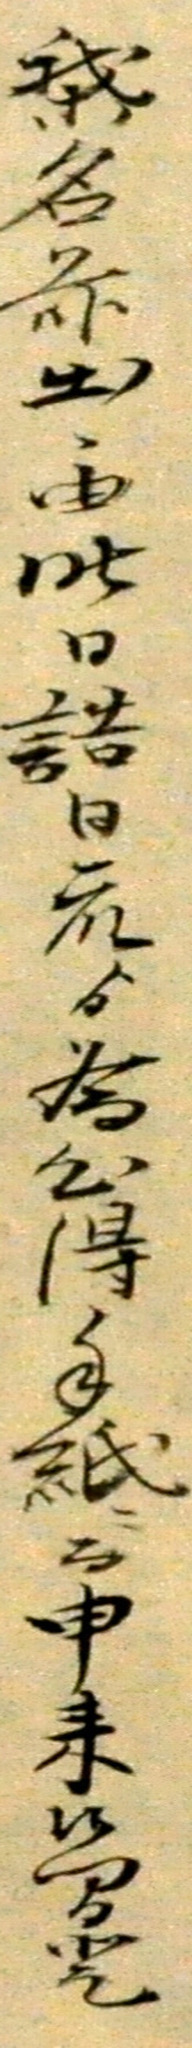我等名前出候由昨日詰日衆ゟ為心得手紙ニ而申来候間登
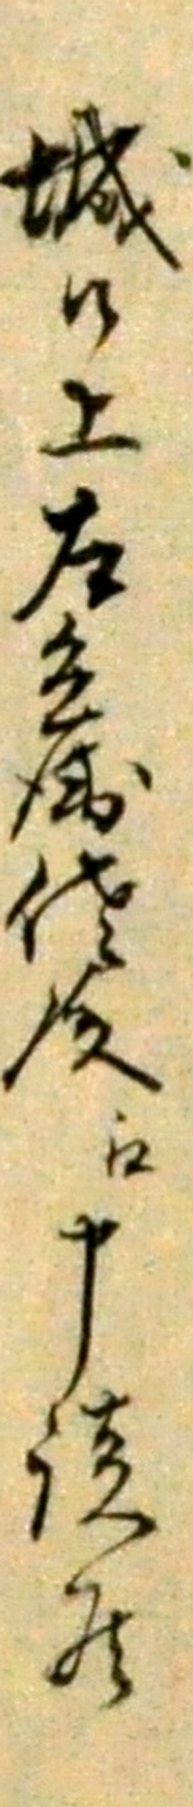城候上左兵衛佐殿申談候
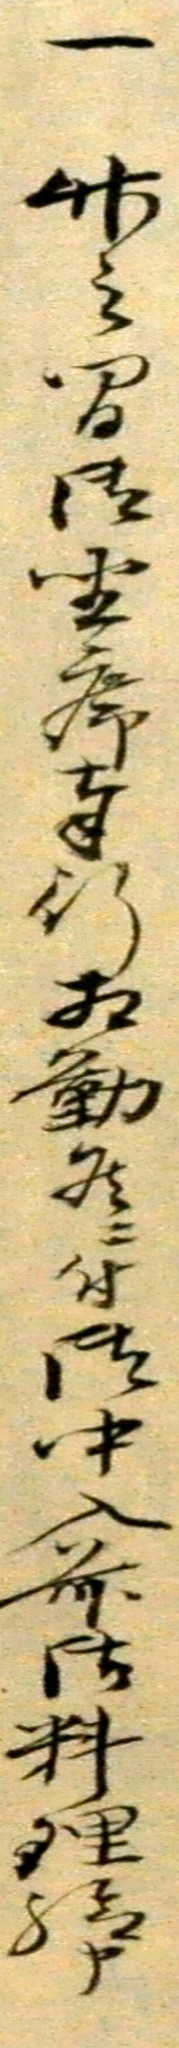一竹之間御坐席奉行相勤候ニ付御中入前御料理給申
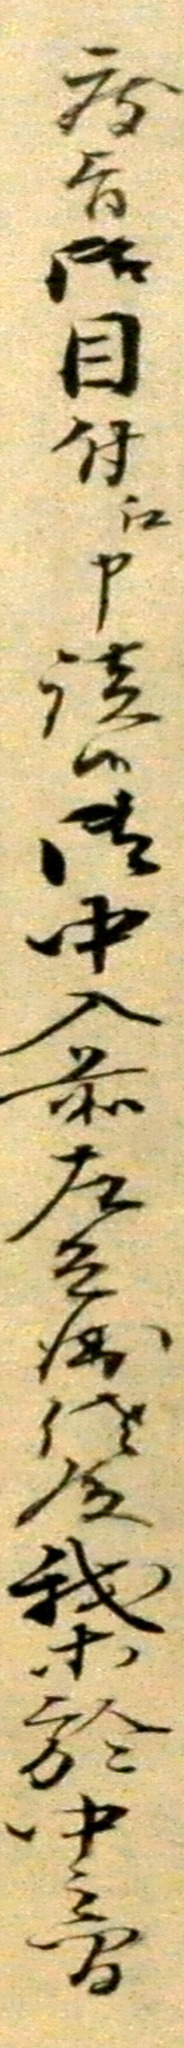度旨御目付え申談候御中入前左兵衛佐殿我等於中之間
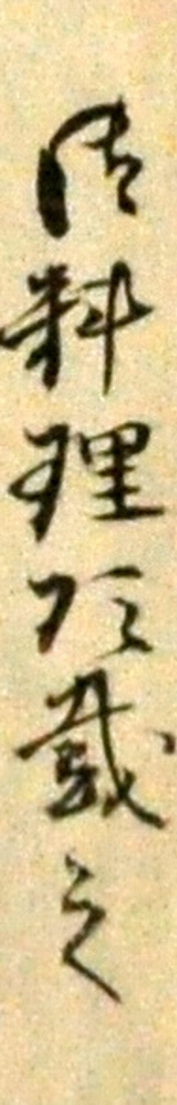御料理頂戴之
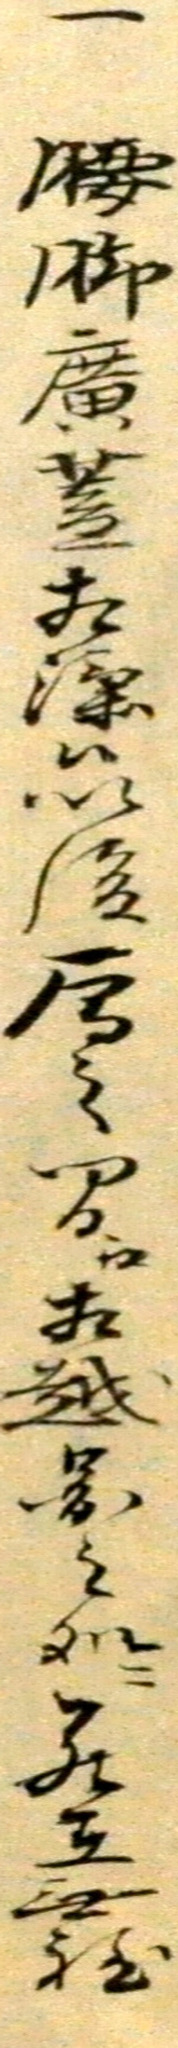一腰脚廣蓋相済候以後雁之間え相越圖之処ニ罷在無程
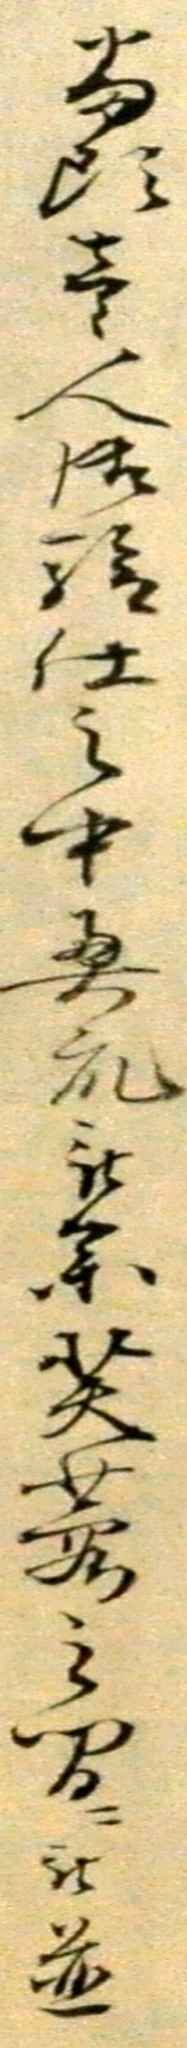番頭壱人御給仕之中奥衆被参芙蓉之間ニ被並
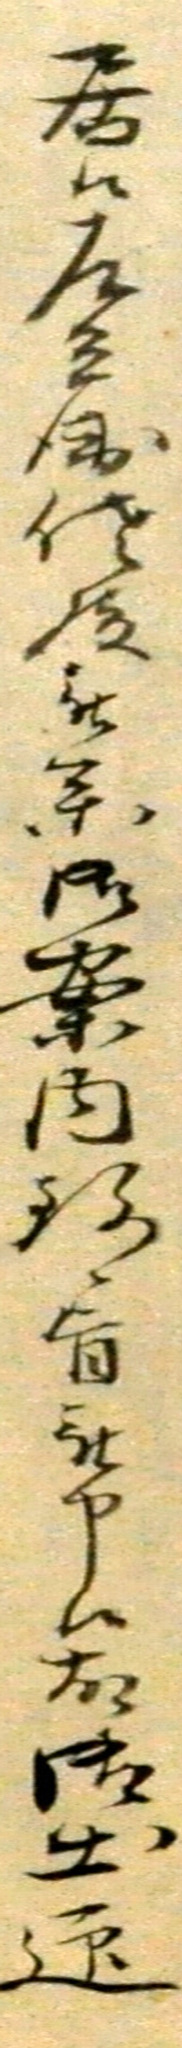居候左兵衛佐殿被参御案内致候旨被申候故御出迎
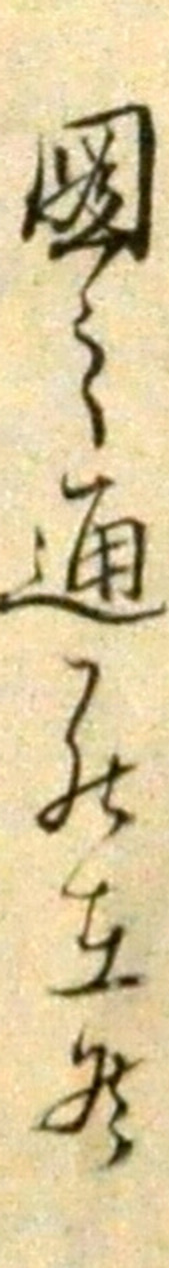圖之通罷在候
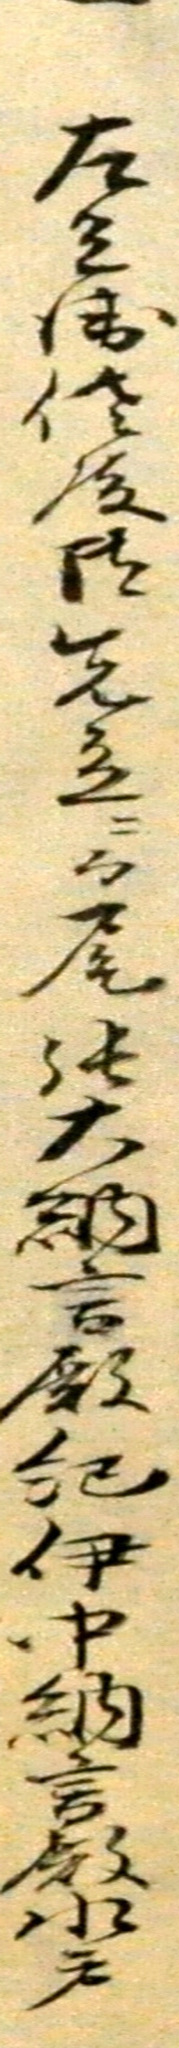一左兵衛佐殿御先立ニ而尾張大納言殿紀伊中納言殿水戸
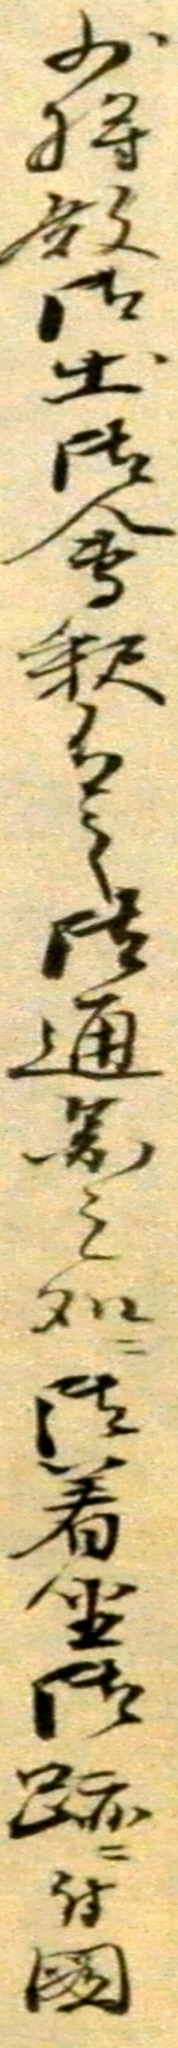少将殿御出御會釈有之御通圖之処ニ御着坐御跡ニ付圖
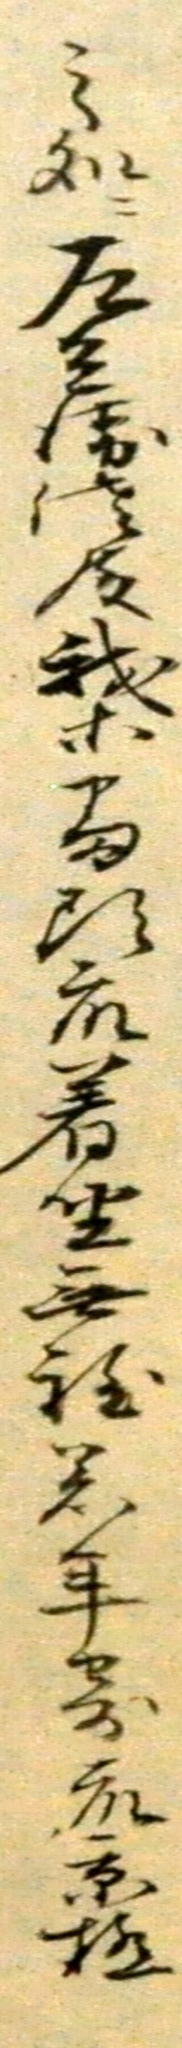之処ニ左兵衛佐殿我等番頭衆着坐無程若年寄衆京極
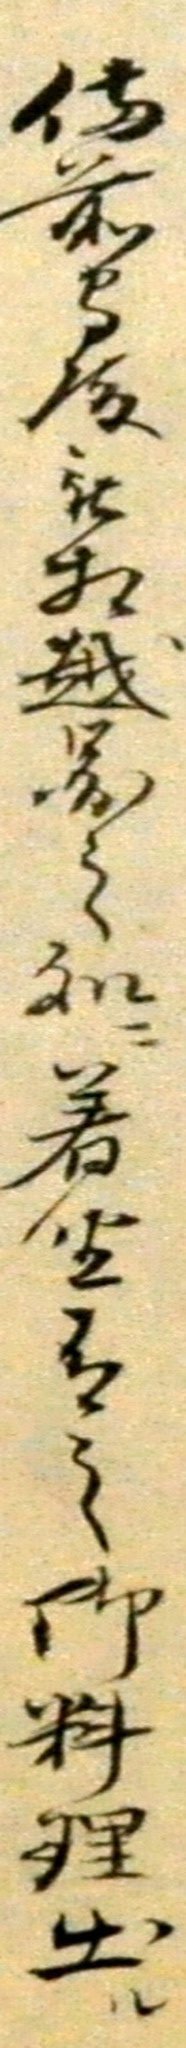備前守殿被相越圖之処ニ着坐有之御料理出ル

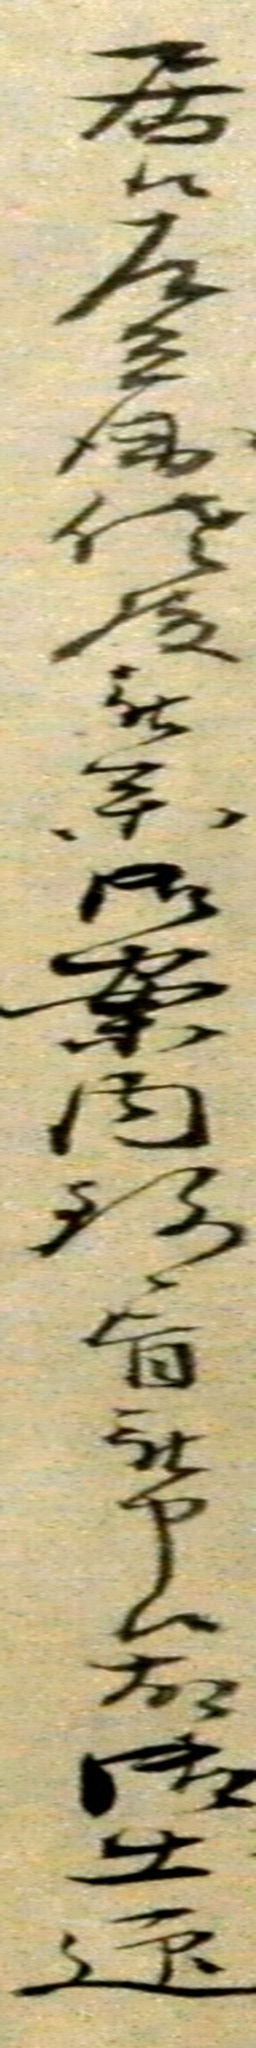居候左兵衛佐殿被参御案内致候旨被申候故御出迎
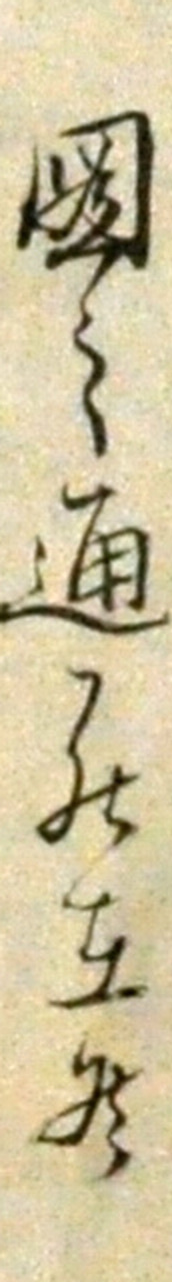圖之通罷在候
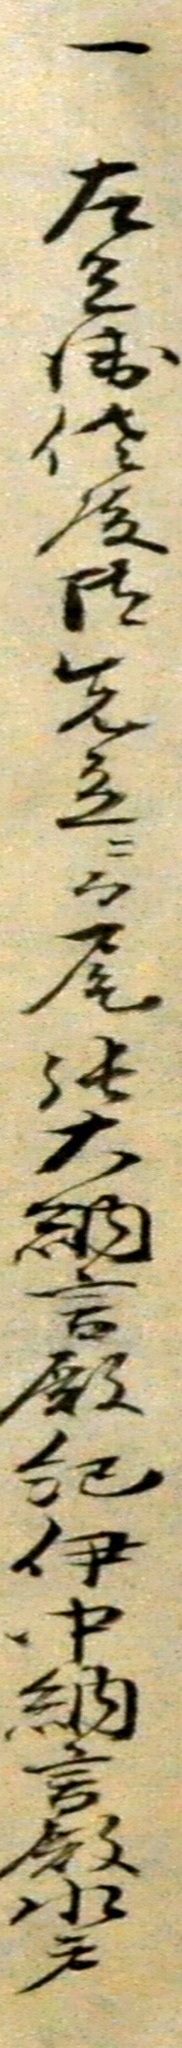一左兵衛佐殿御先立ニ而尾張大納言殿紀伊中納言殿水戸
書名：竹ノ間御座席奉行勤方控外
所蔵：伊那市立高遠町図書館・合同会社AMANE
